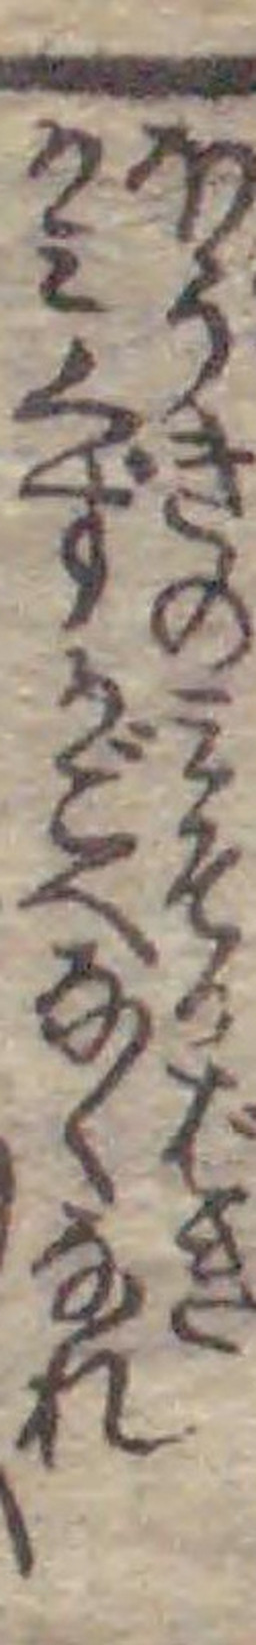かみくずかごへなくなれ

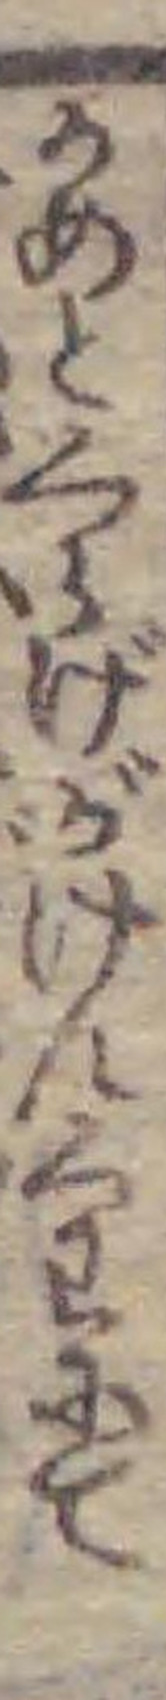かめとくらげがけんくわにて
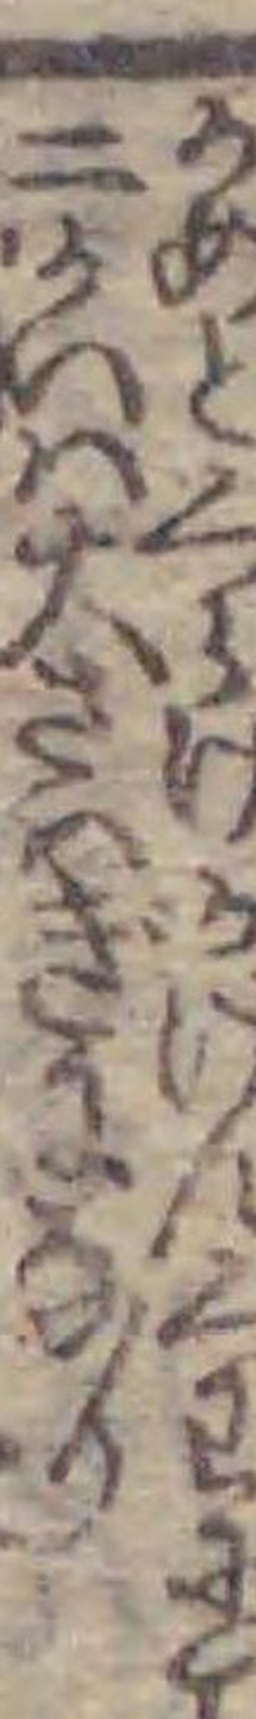二かいは大さはぎになり
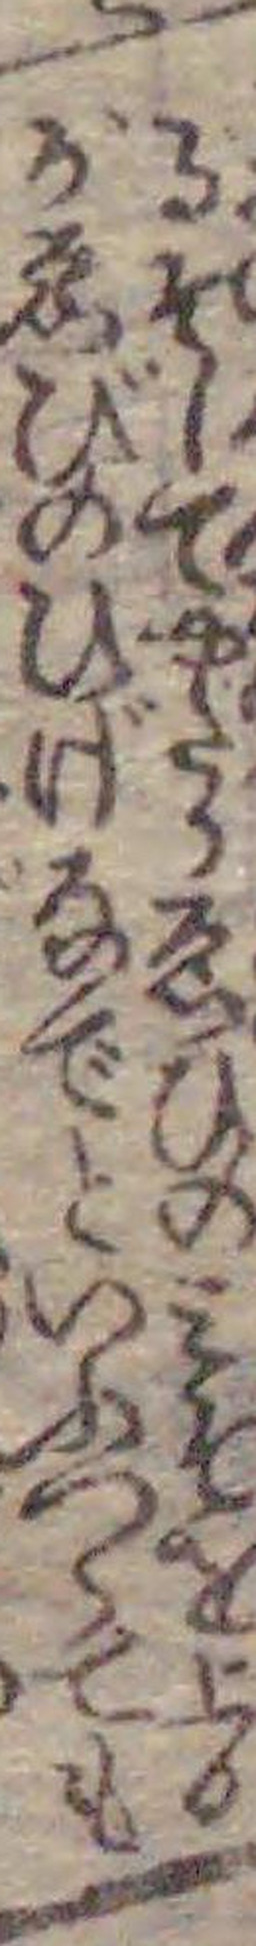がゑびのひげなでといふつらでも
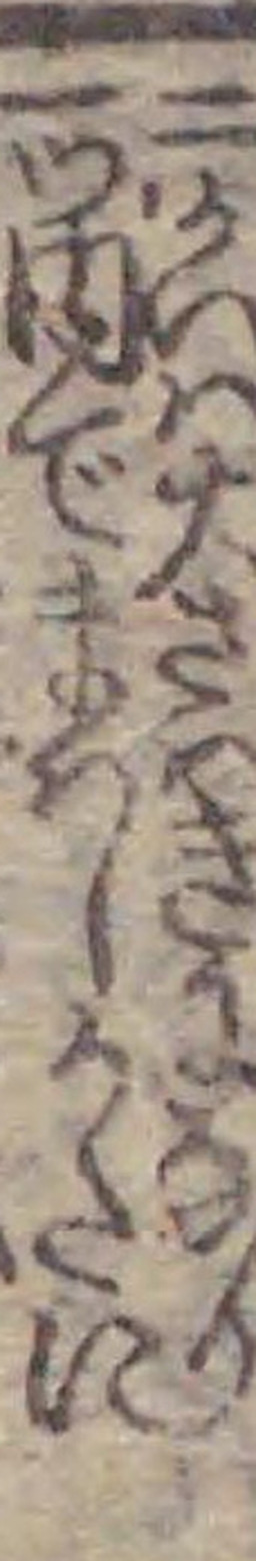一つ内でまはしかたに
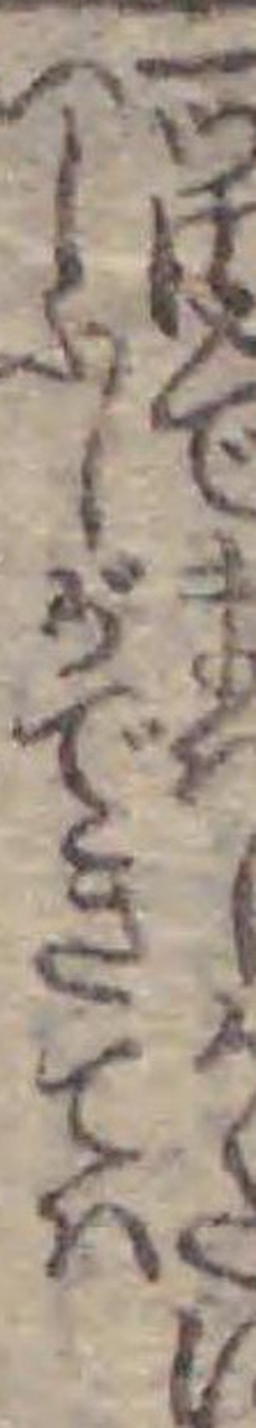いしふしができては
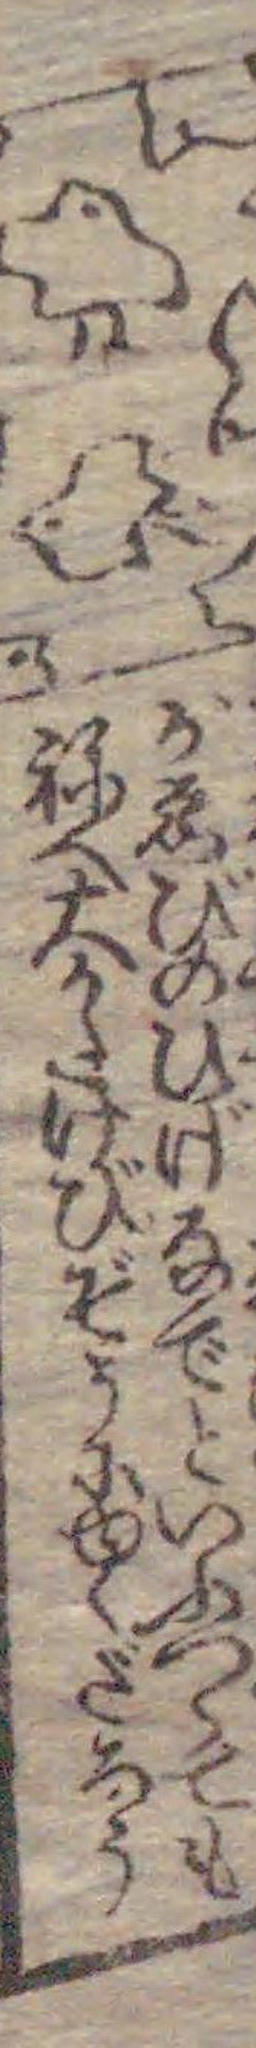ねへ大かたけびぞうにゆくだろう
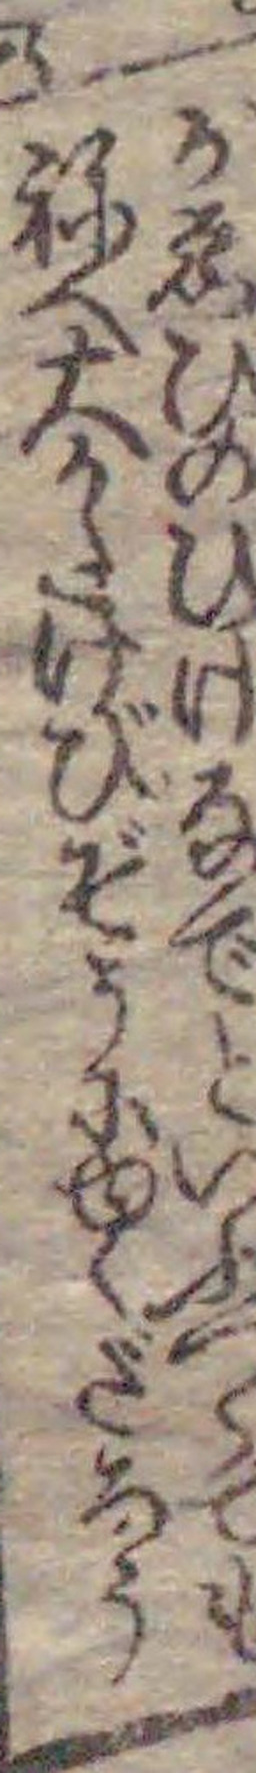ねへ大かたけびぞうにゆくだろう
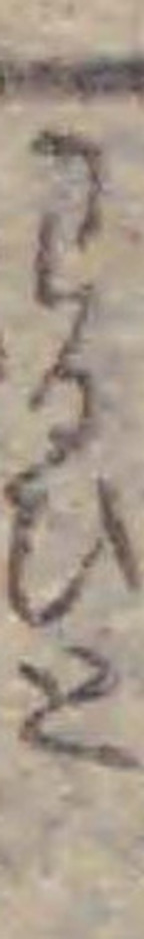わるひと
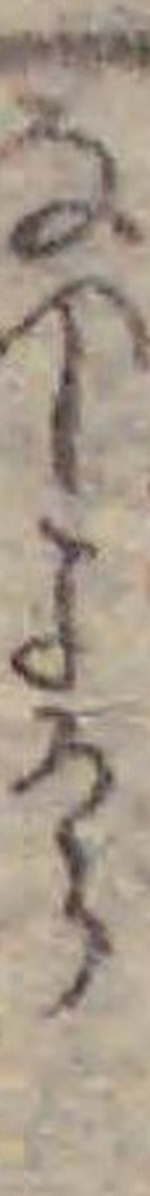ないしよから
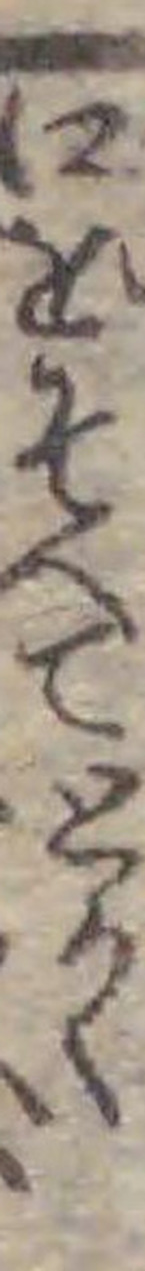口をそろへてとかく
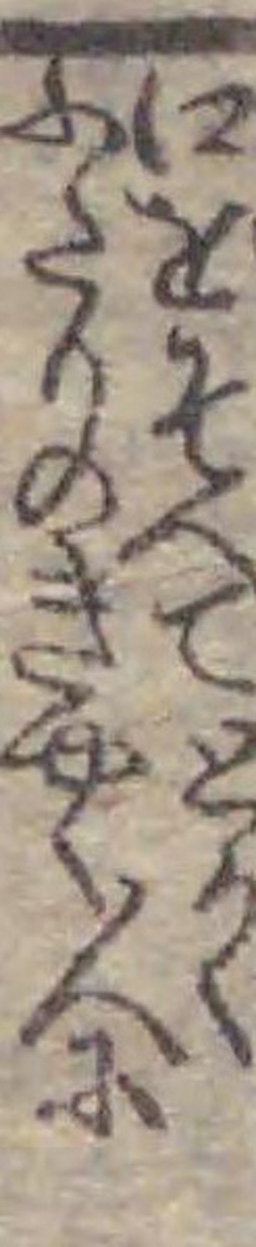ふたりのきやくへふ
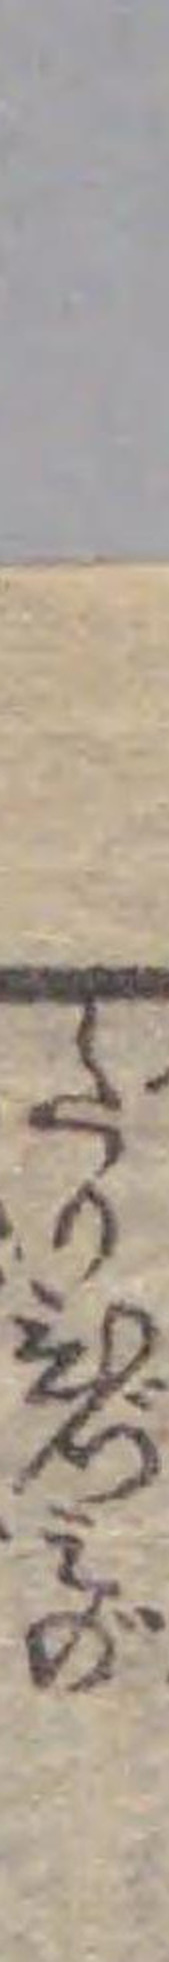たりひづみの
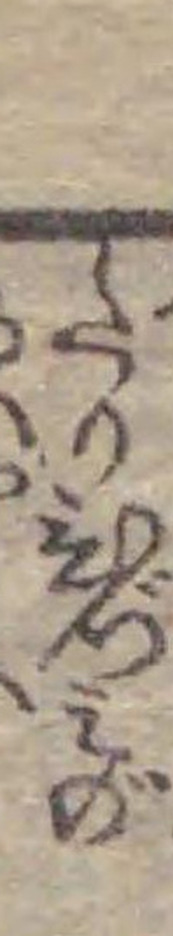たりひづみの
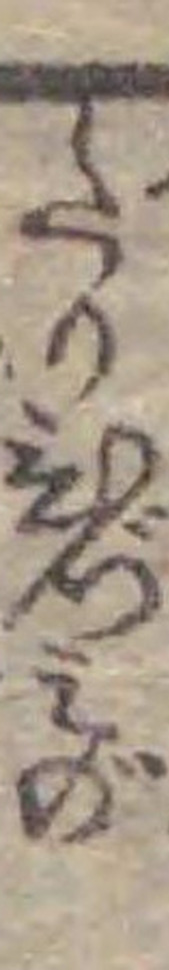たりひづみの
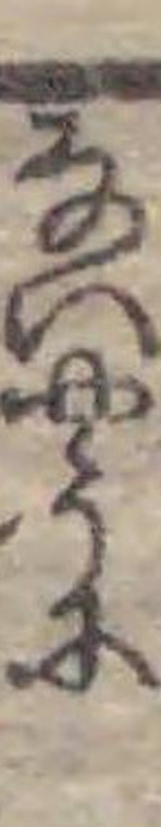ないやうに
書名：竜宮苦界玉手箱 : 3巻
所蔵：国立国会図書館 National Diet Library, JAPAN
